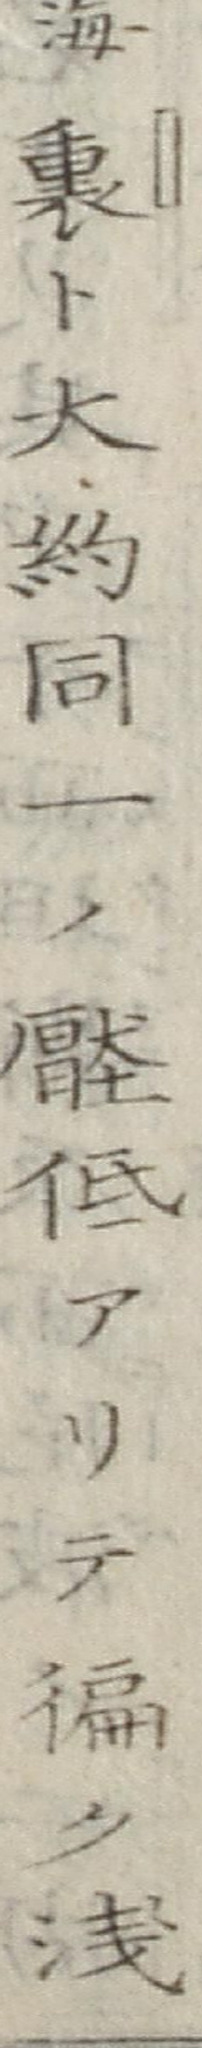裏ト大約同一ノ圧低アリテ徧ク浅
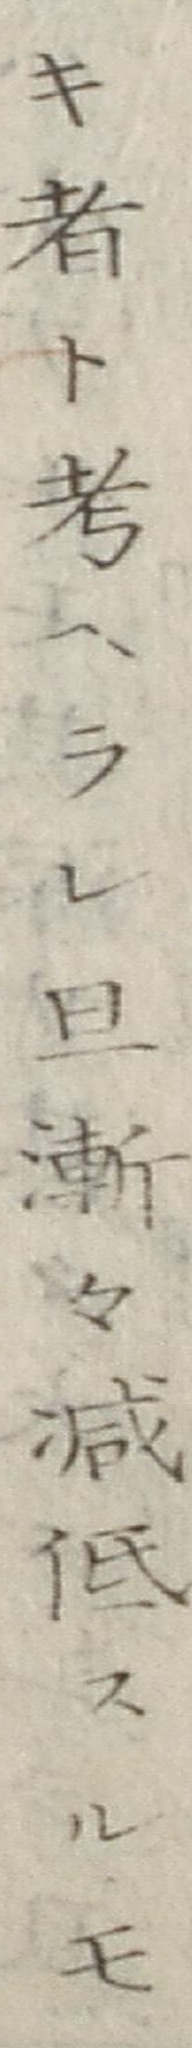キ者ト考ヘラレ旦漸々減低スルモ
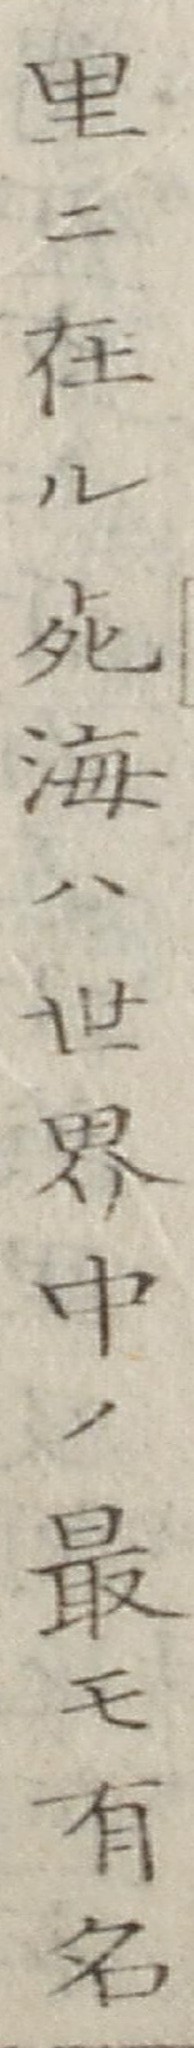里ニ在ル死海ハ世界中ノ最モ有名
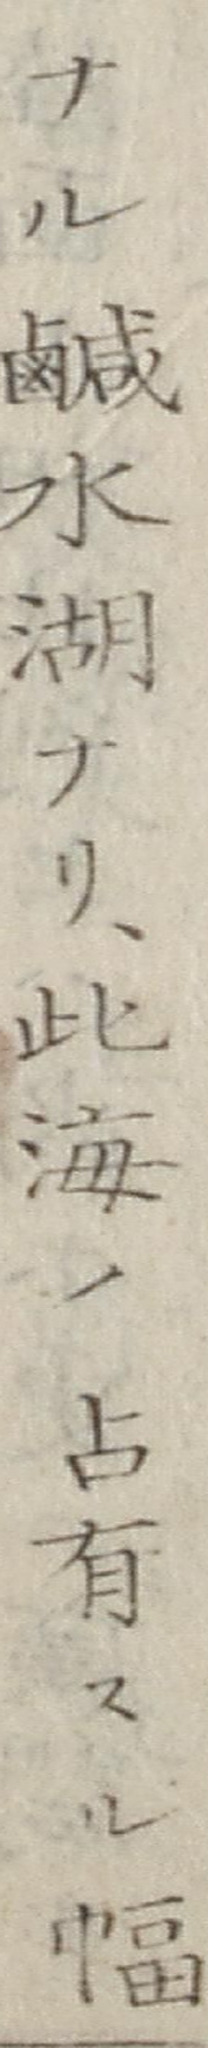ナル鹹水湖ナリ、此海ノ占有スル幅
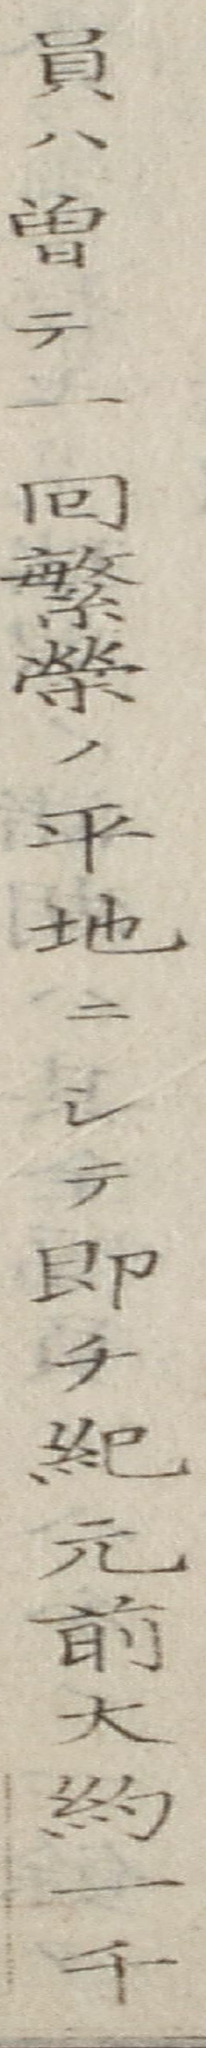員ハ曽テ一回繁栄ノ平地ニシテ即チ紀元前大約一千
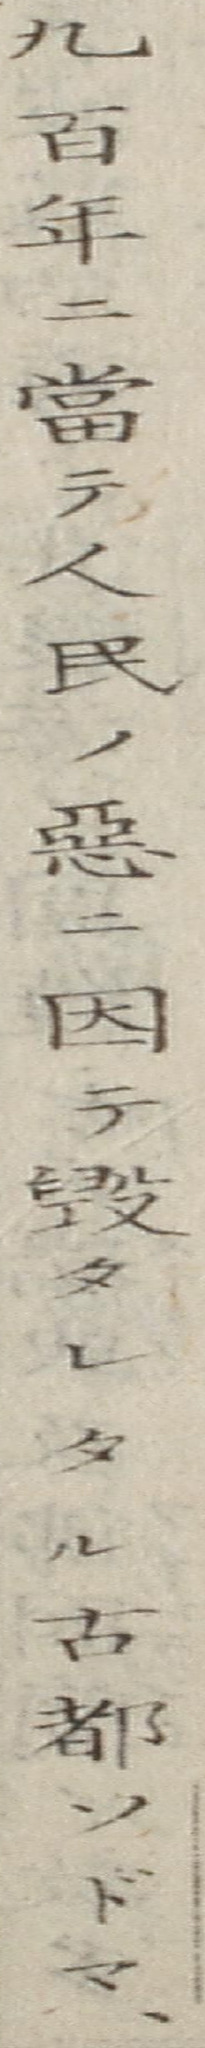九百年ニ当テ人民ノ悪ニ因テ毀タレタル古都ソドマ、
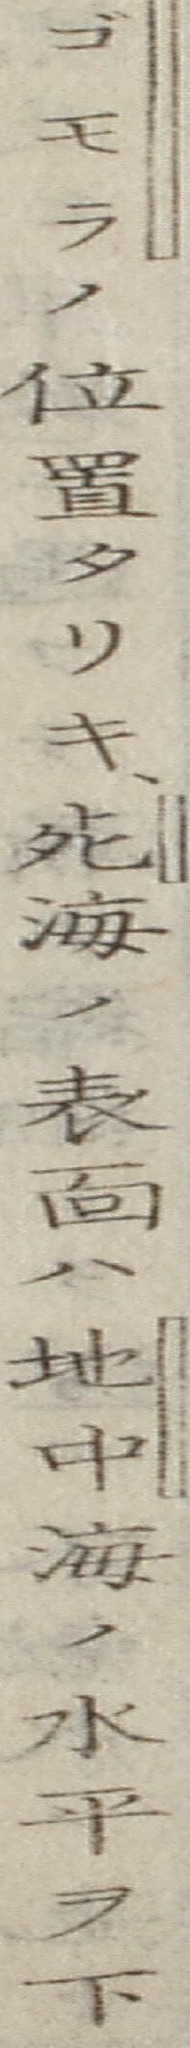ゴモラノ位置タリキ、死海ノ表面ハ地中海ノ水平ヲ下
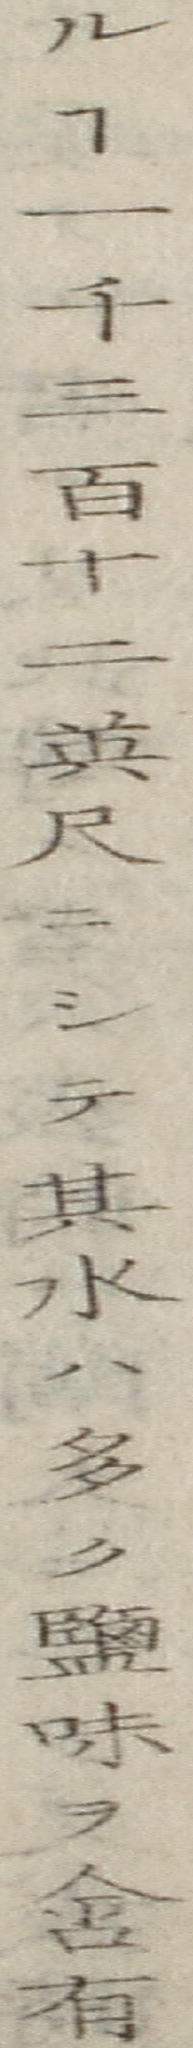ルヿ一千三百十二英尺ニシテ其水ハ多ク塩味ヲ含有
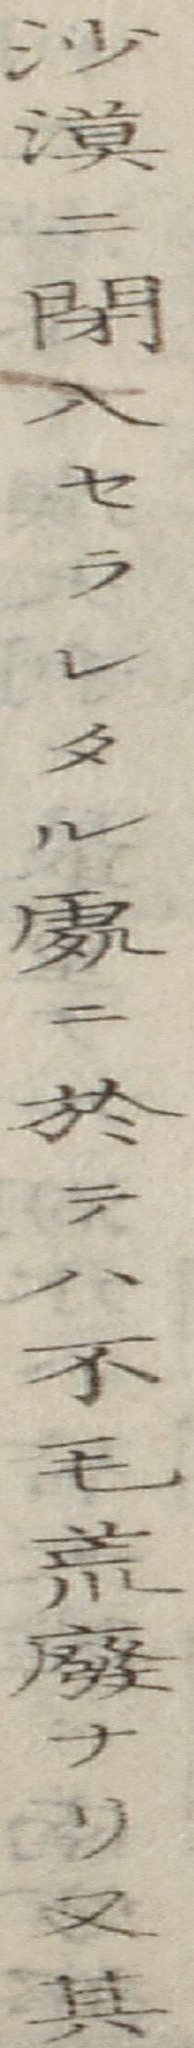沙漠ニ閉入セラレタル処ニ於テハ不毛荒廃ナリ又其
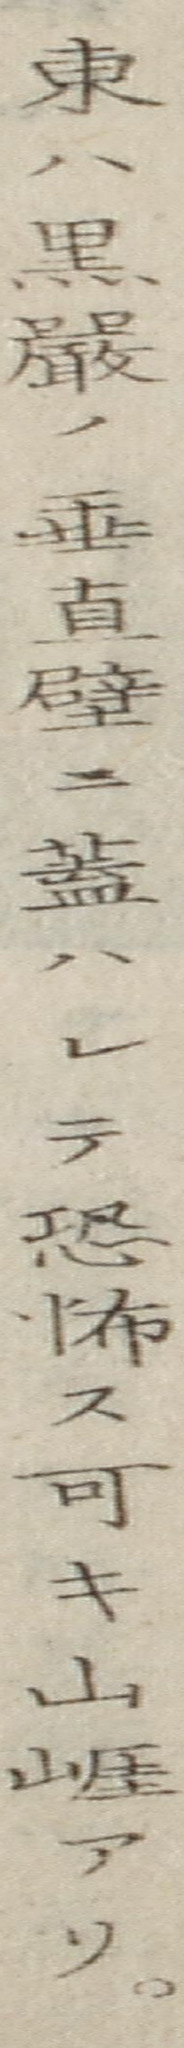東ハ黒厳ノ垂直壁ニ蓋ハレテ恐怖ス可キ山崖アリ。
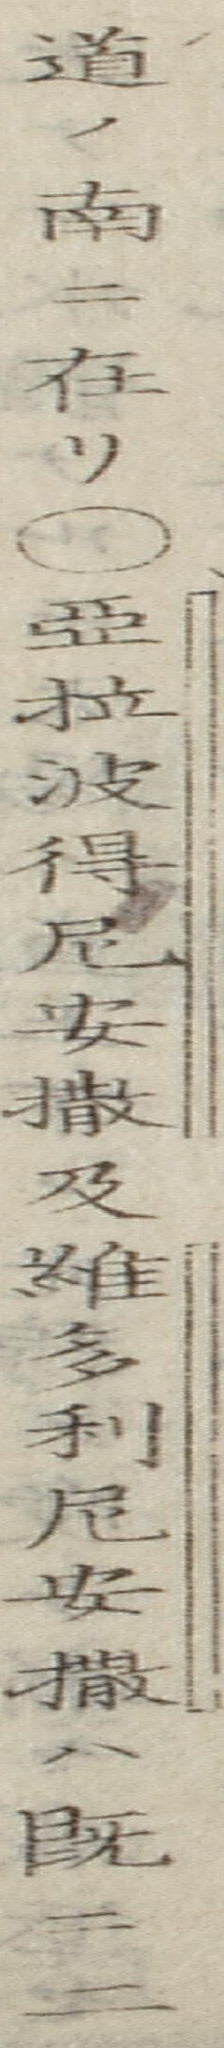道ノ南ニ在リ○亜拉波得尼安撤及維多利尼安撤ハ既ニ二
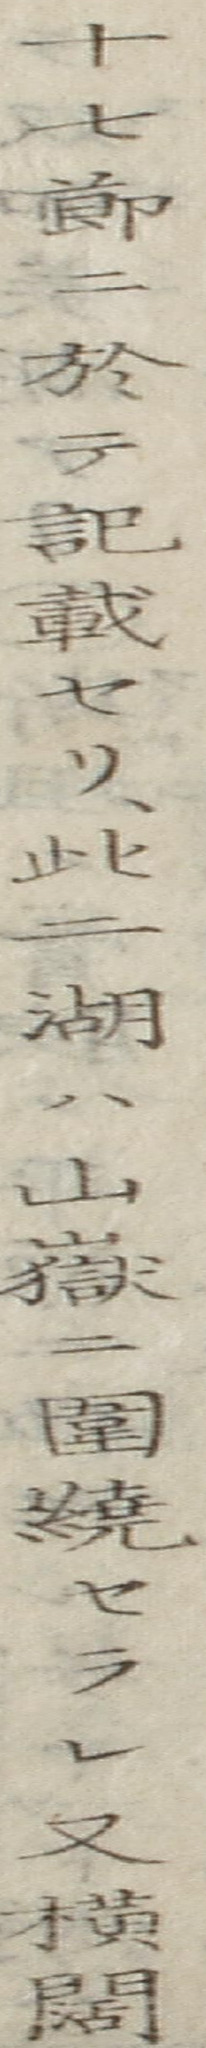十七節ニ於テ記載セリ、此二湖ハ山嶽ニ囲繞セラレ又横闊
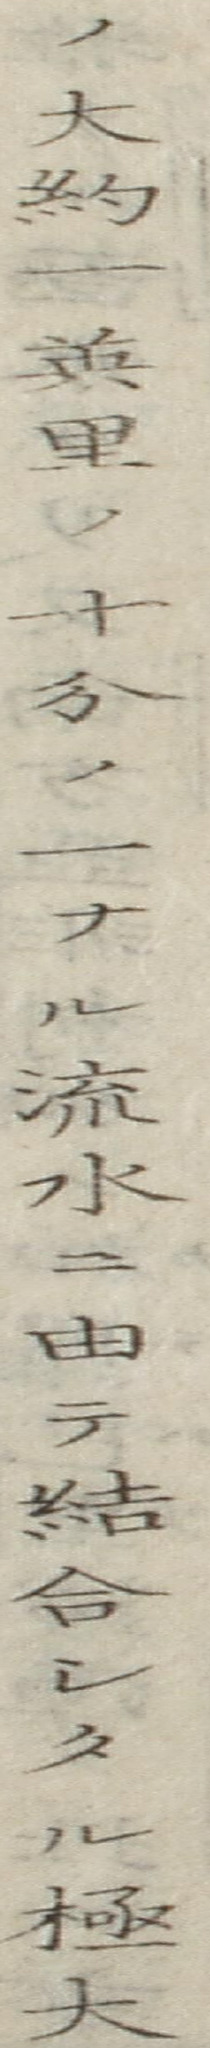ノ大約一英里ノ十分ノ一ナル流水ニ由テ結合シタル極大
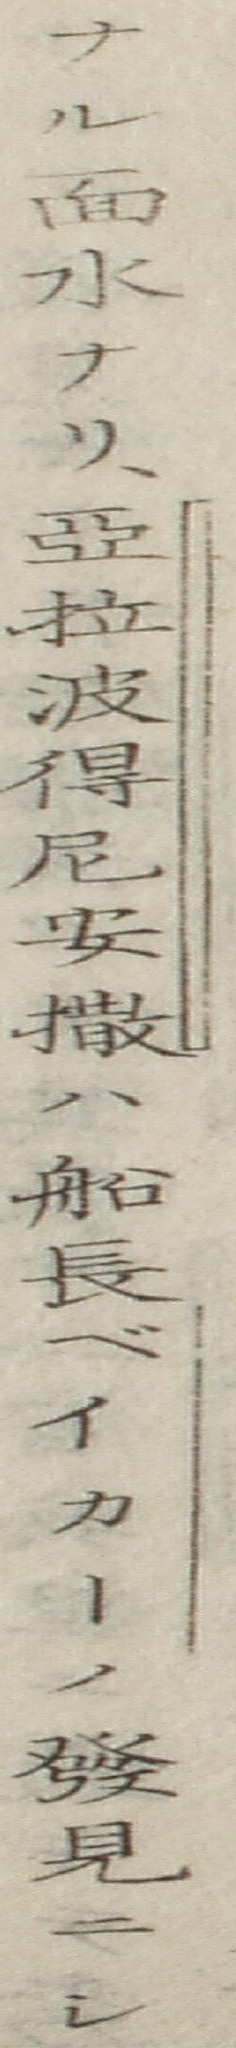ナル面水ナリ、亜拉波得尼安撤ハ船長ベイカーノ発見ニシ
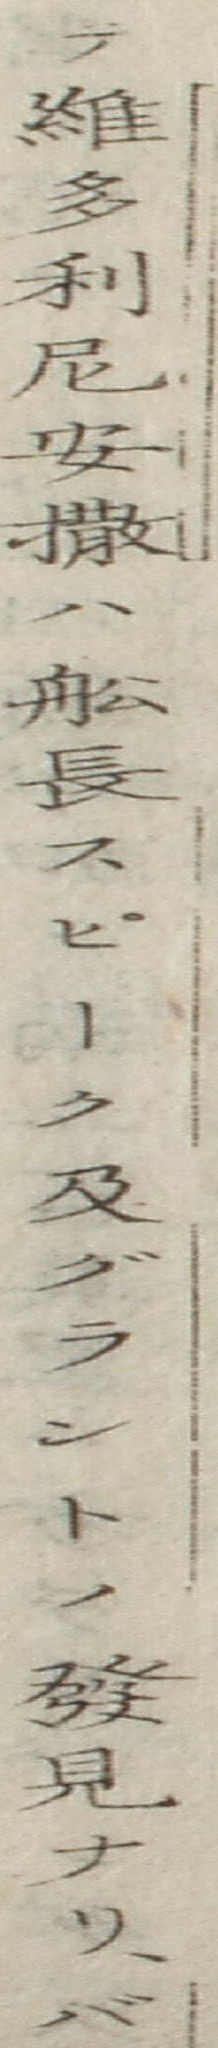テ維多利尼安撤ハ船長スピーク及グラントノ発見ナリ、バ
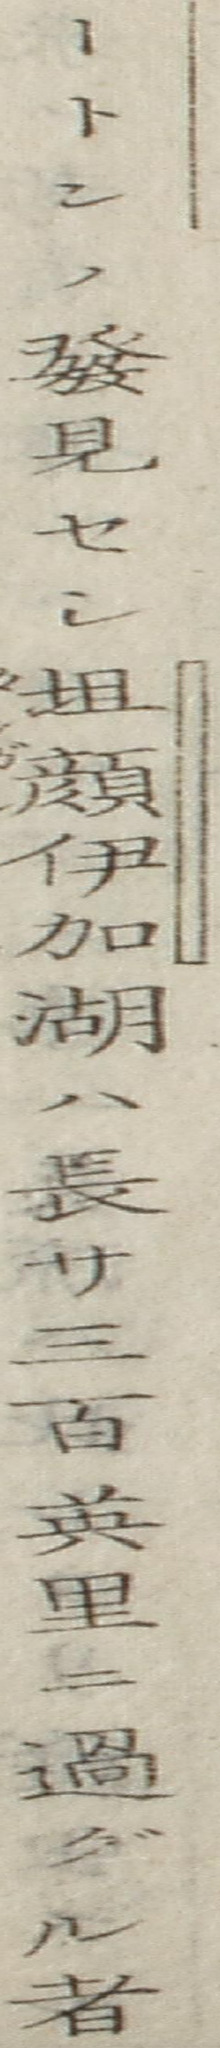ートンノ発見セシ担顔伊加湖ハ長サ三百英里ニ過グル者
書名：地形論　巻二
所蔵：東京大学地震研究所図書室 Earthquake Research Institute Library, The University of Tokyo, JAPAN
